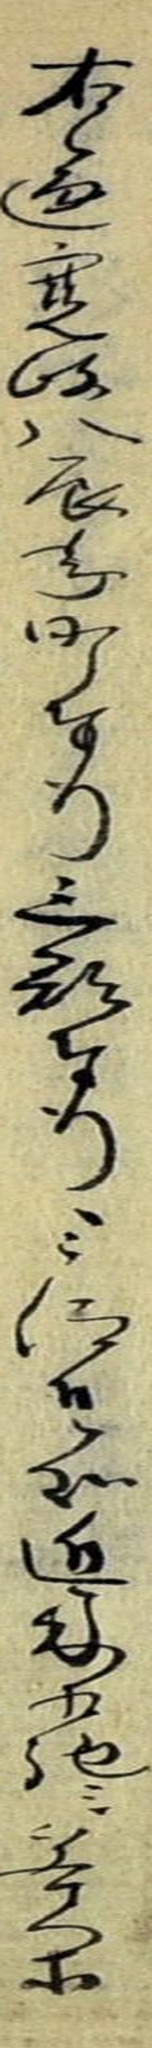右之通寛政八辰年町奉行三郡奉行へ被仰付候処近来相弛ミ等閑
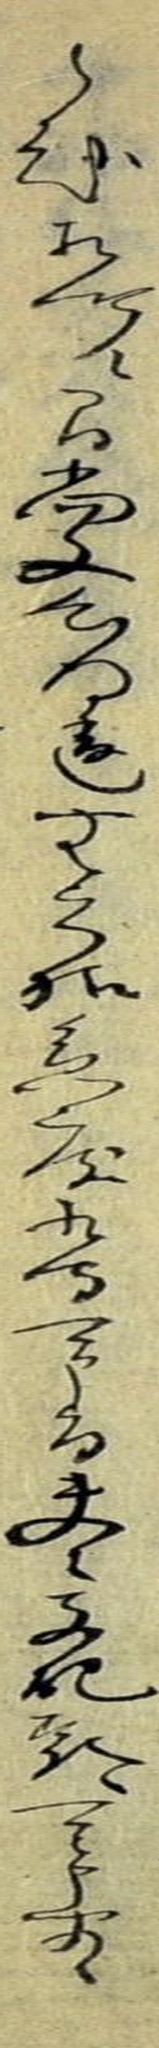之趣相聞候間尚又心得違無之様急度相守可申旨夫々支配頭へ可被申聞候
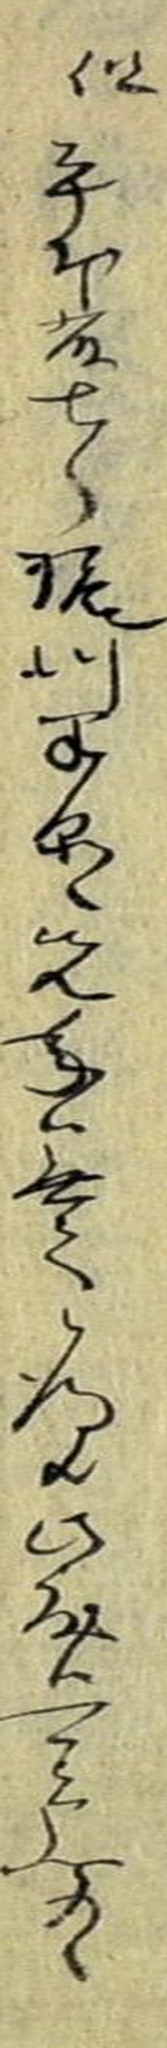但平本藤七郎梶川半兵衛へ先年は無之候得共此度は可被申聞之
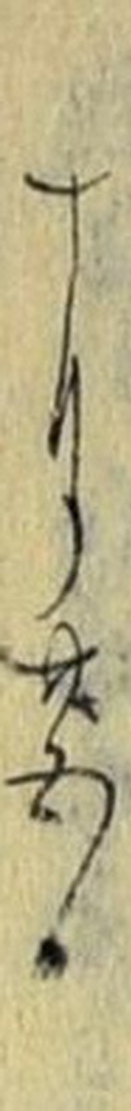十二月五日
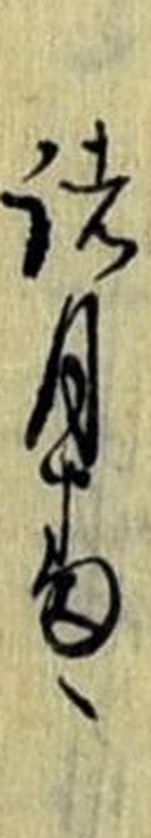諸月番へ
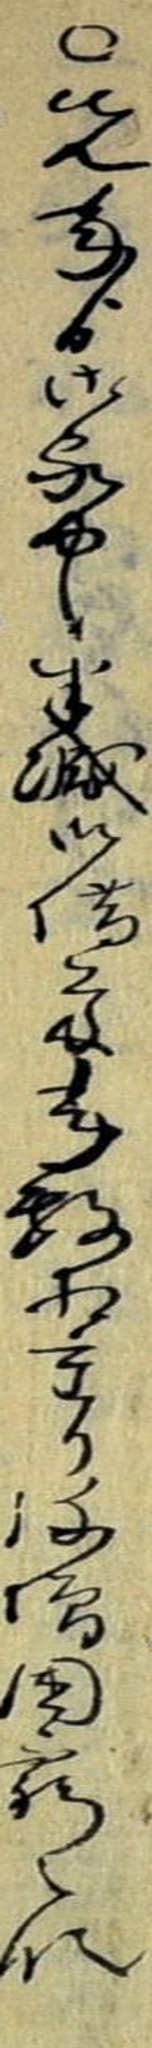○先年ゟ御家中半減御借米年数相重り弥増困窮候段
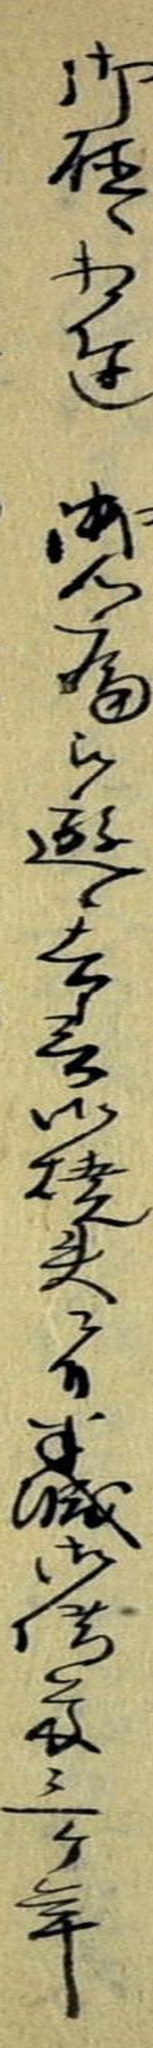御聴へ相達御心痛被遊候去春御焼失に付半減御借米
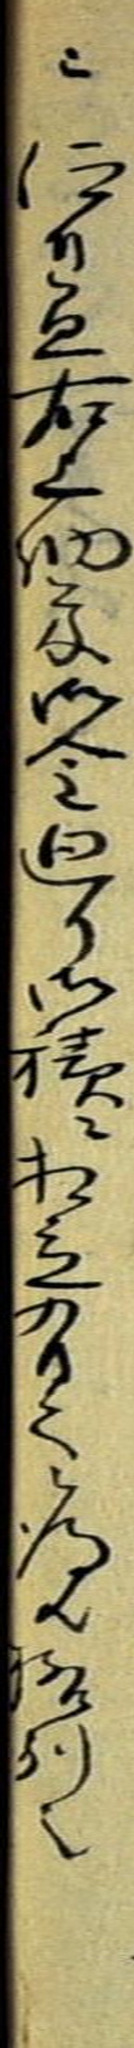被仰付置右上納米御金廻り御積に相立有之候得共格別之
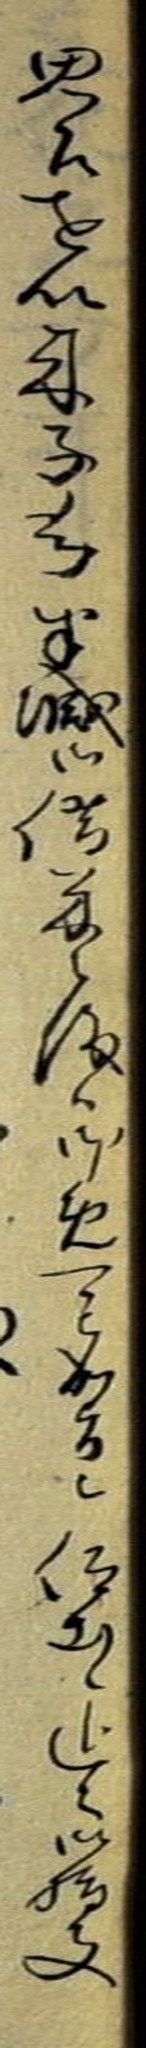思召を以来子年半減御借米之儀は御免可被成旨被仰出候追々御指支
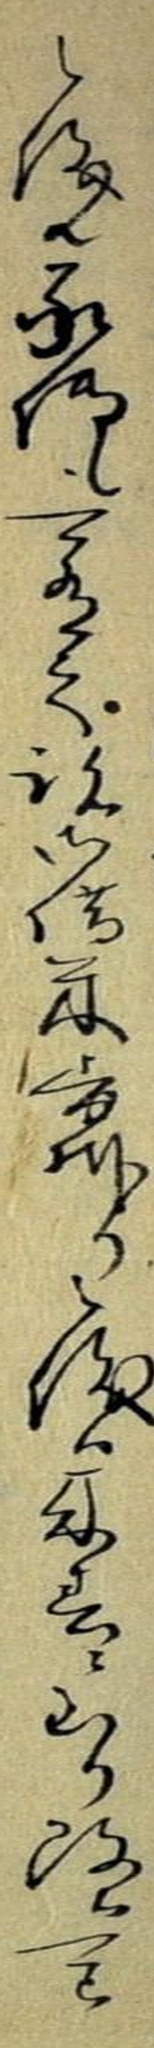之儀共承伝も可有之弥御借米歩掛り之儀は來春に至り改而可被
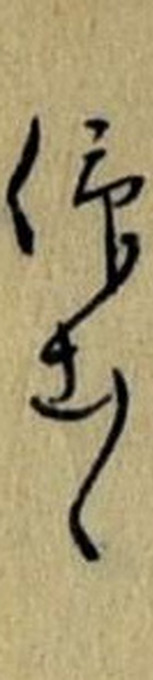仰出候
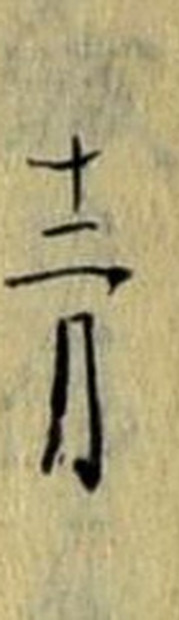十二月
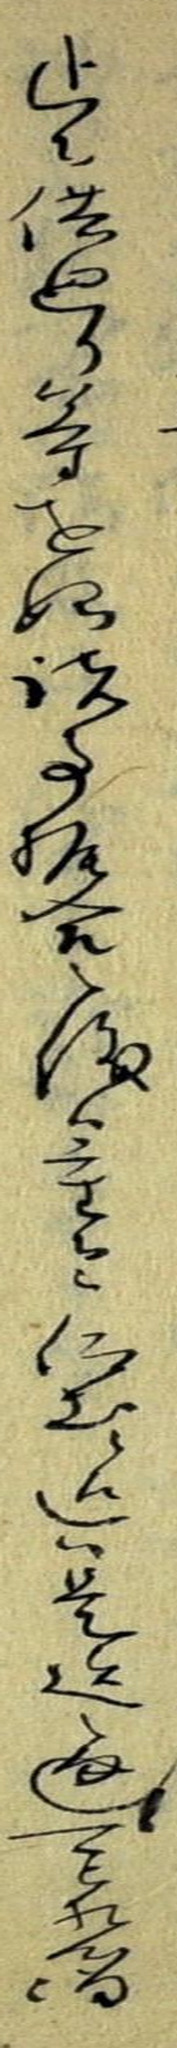追々借廻り等を始諸事振合之儀は重而被仰出候迄は是迄之通可被相心得候
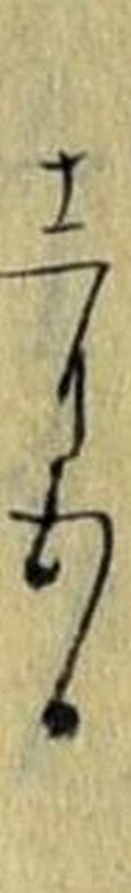十二月五日
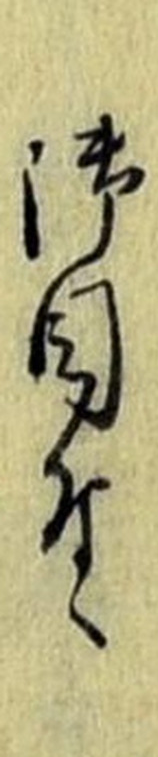御目付へ
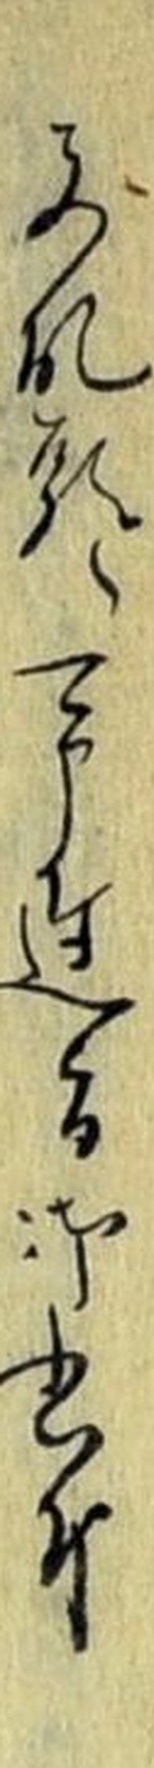支配頭へ可申達旨御書付
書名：命令之部 四
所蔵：福井県文書館 Fukui Prefectural Archives
